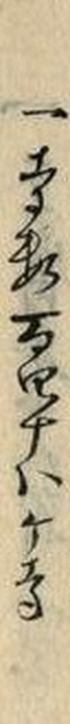一寺数百四十八ケ寺
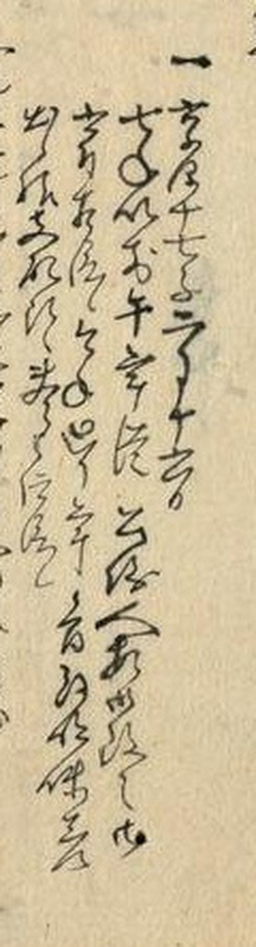七年以前午年従公儀人数御改之御
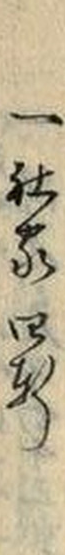一社家四軒
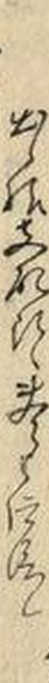出候様支配頭へ夫々被仰渡候
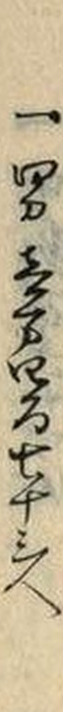一男壱万四百七十三人
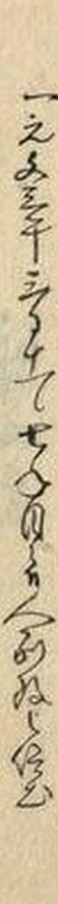一元文三午三月十一日七年目ニ付人別改被仰出
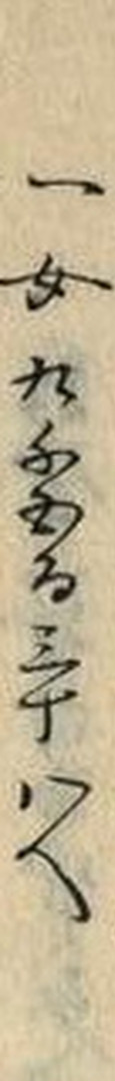一女九千五百三十八人
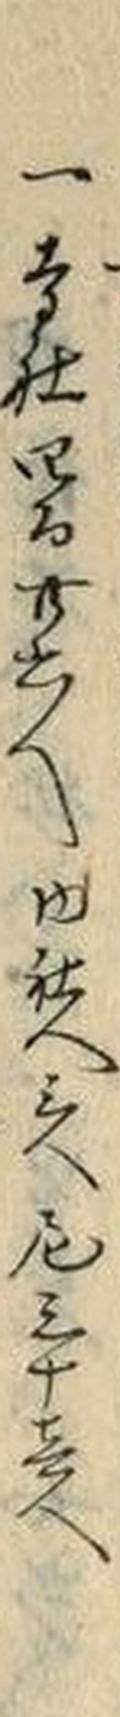一寺社四百廿六人内社人三人尼三十壱人
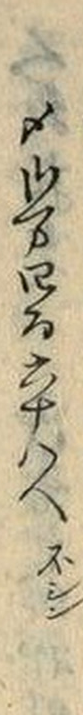〆弐万四百六十八人不シン

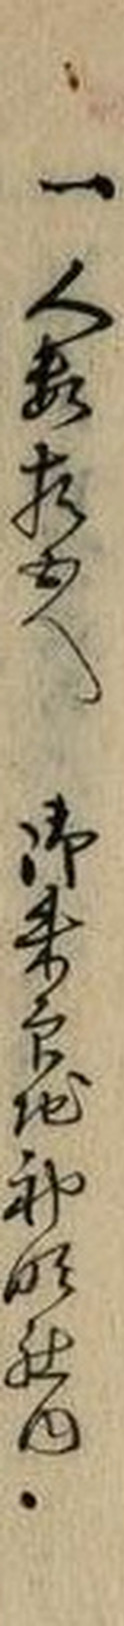一人数拾五人御朱印地神明社内
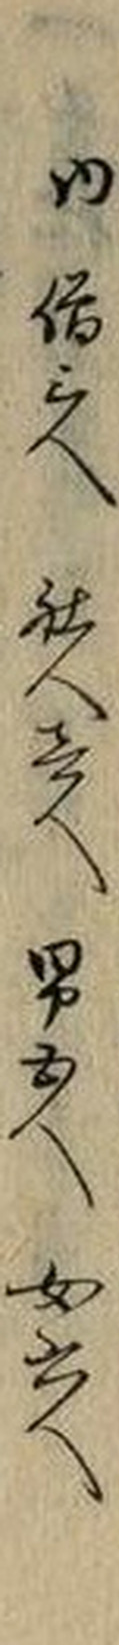内僧三人社人壱人男五人女六人
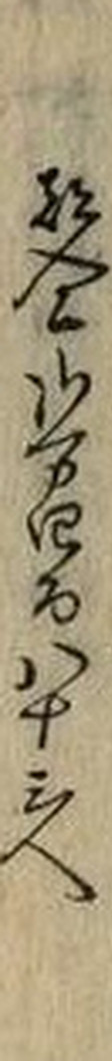都合弐万四百八十三人
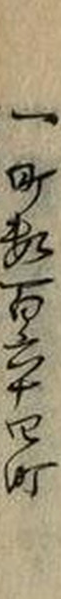一町数百六十四町
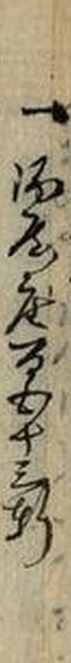一酒屋座百五十三軒
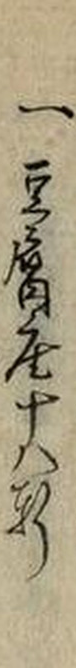一豆腐座十八軒
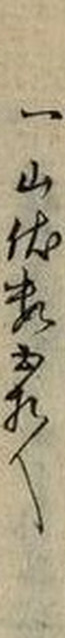一山伏数五拾人
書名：御国他国諸事之部
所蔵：福井県文書館 Fukui Prefectural Archives
